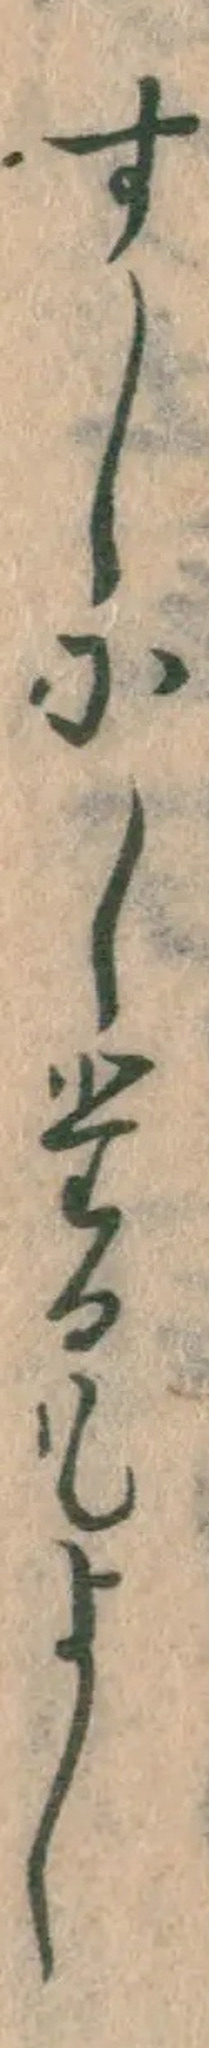すしにしたるもよし
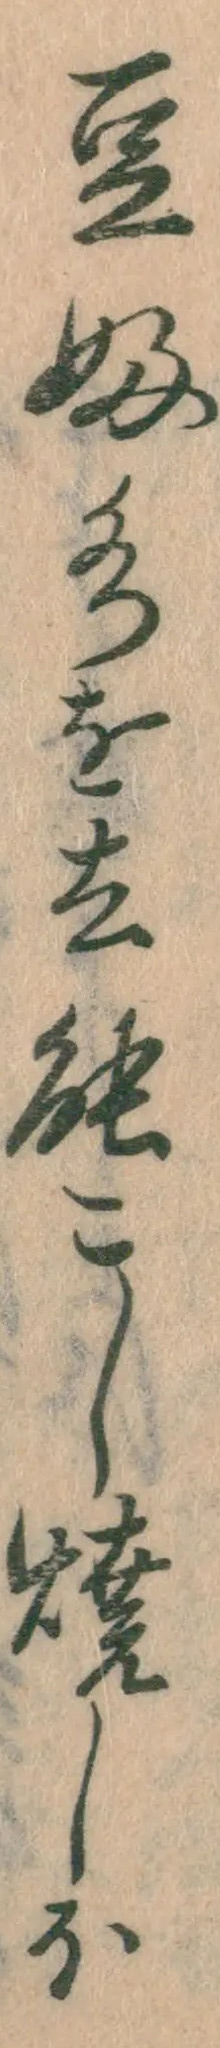豆ふ水を去能こし焼しほ
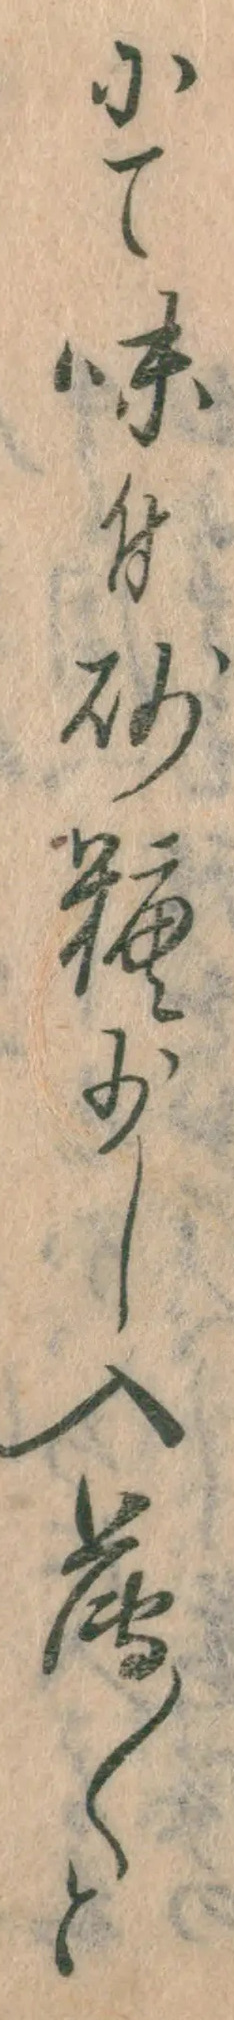にて味付砂糖少し入薄〳〵と
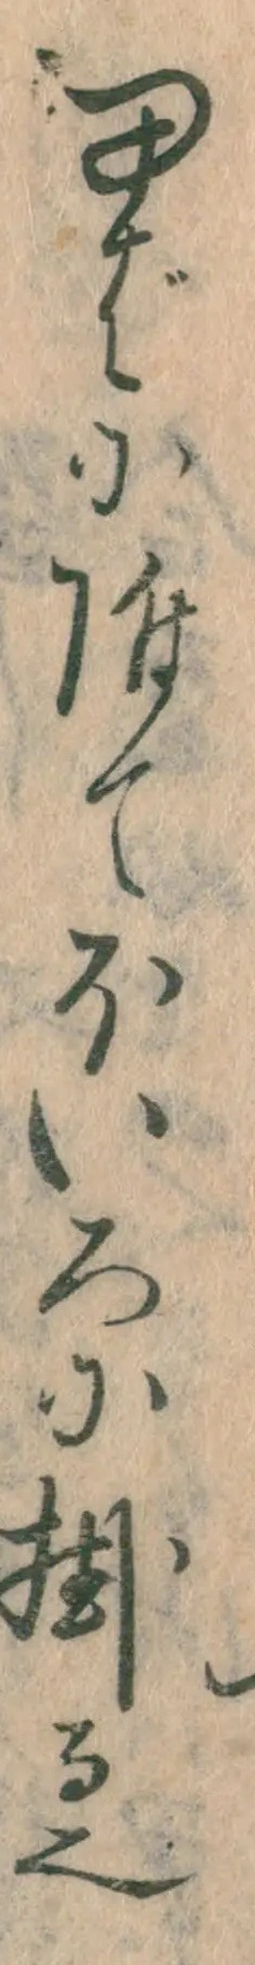ゆばに附てほいろに掛る也
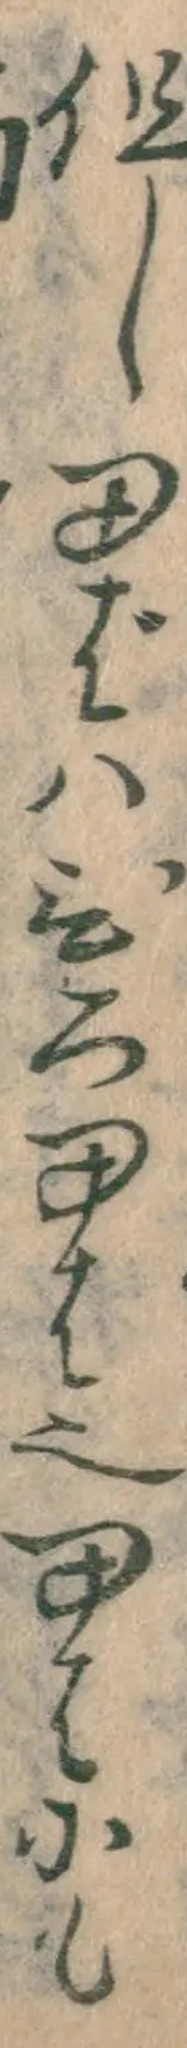但しゆばはひろゆは也ゆはにも
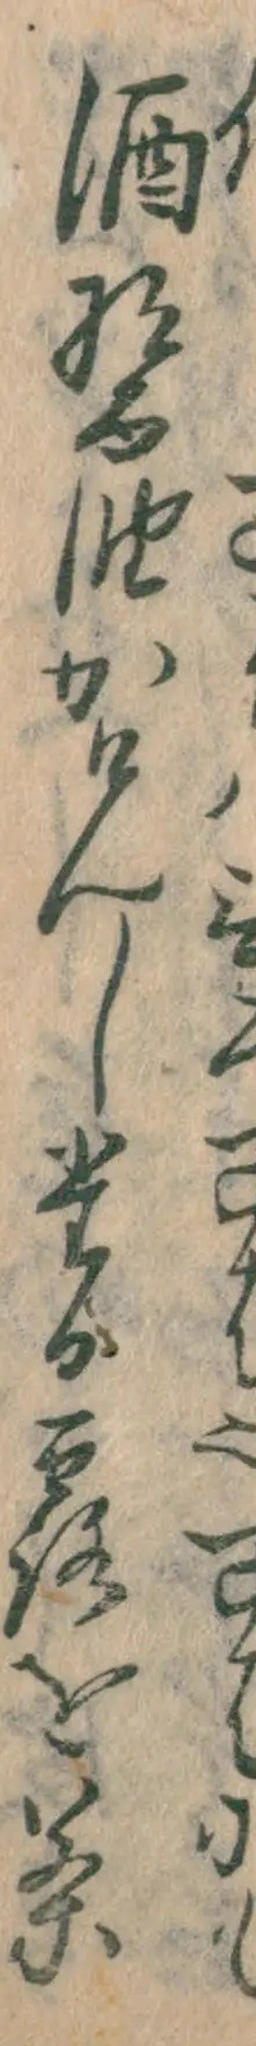酒醤油かけんしたる露を茶

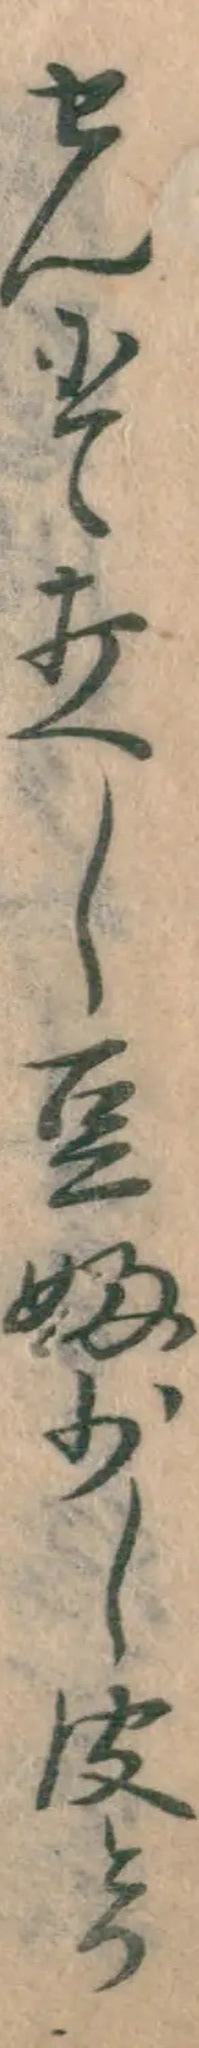せんにて打へし豆ふ少し皮とり
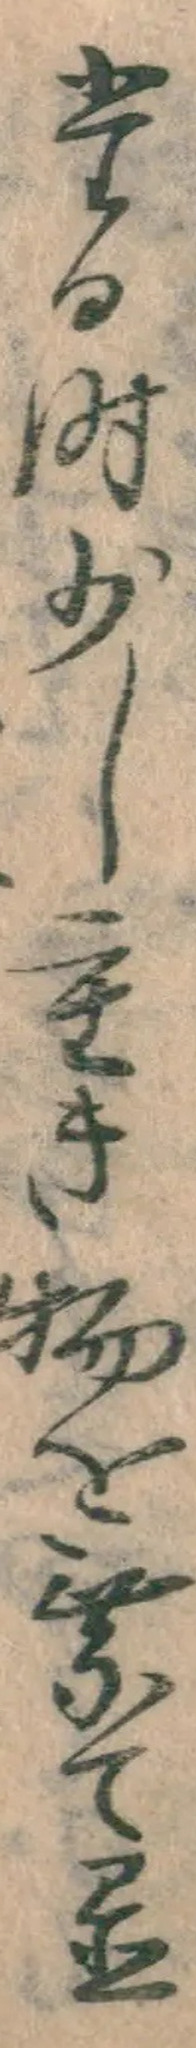たる時少し重き物を乗て置
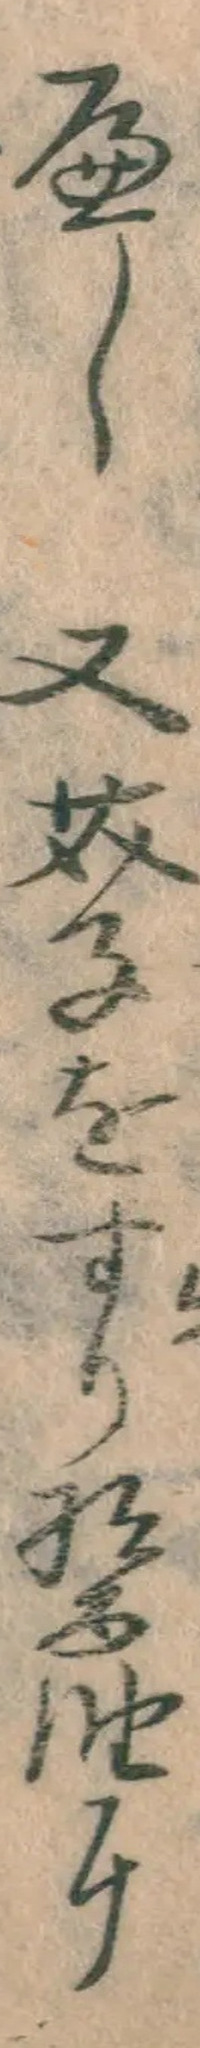へし又芥子をすり醤油に
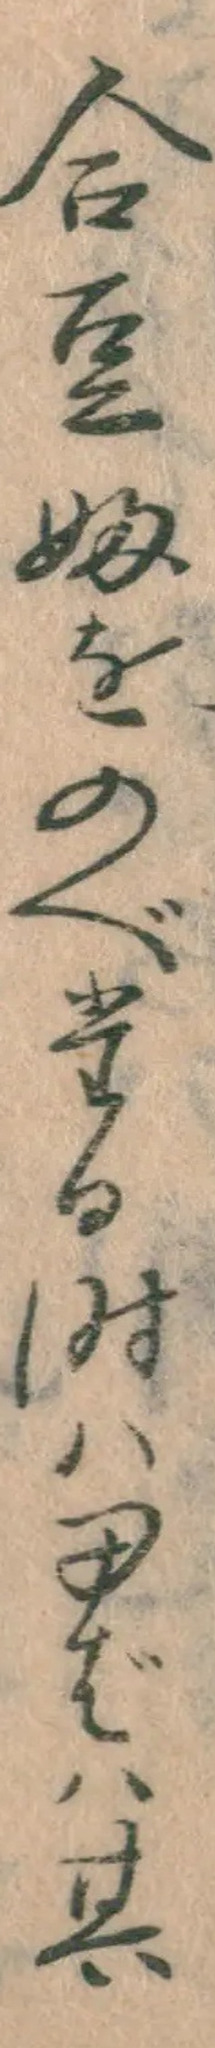合豆ふをのべたる時はゆばは其
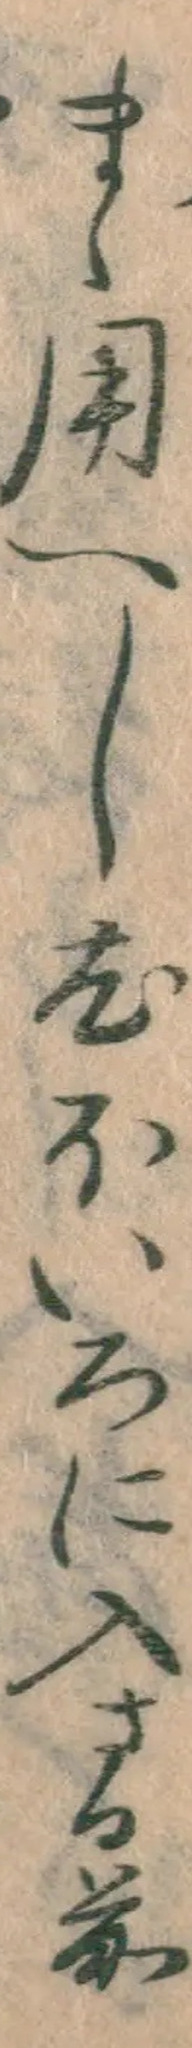まゝ用へし尤ほいろに入さる前
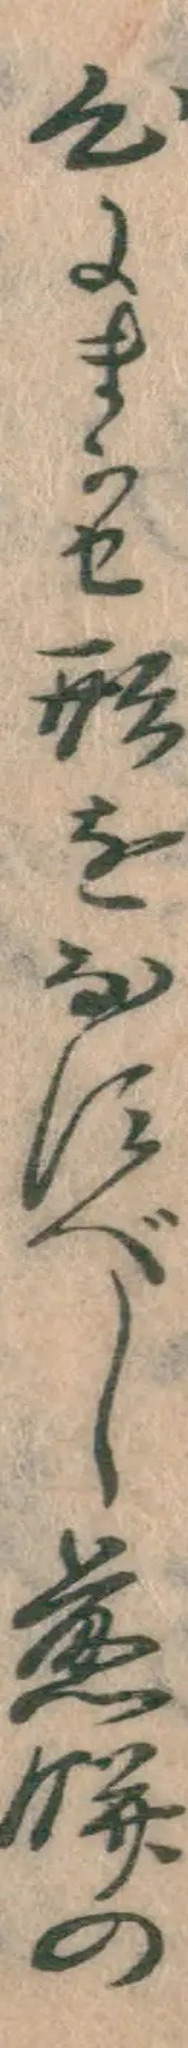心にまかせ形をなすべし煎餅の
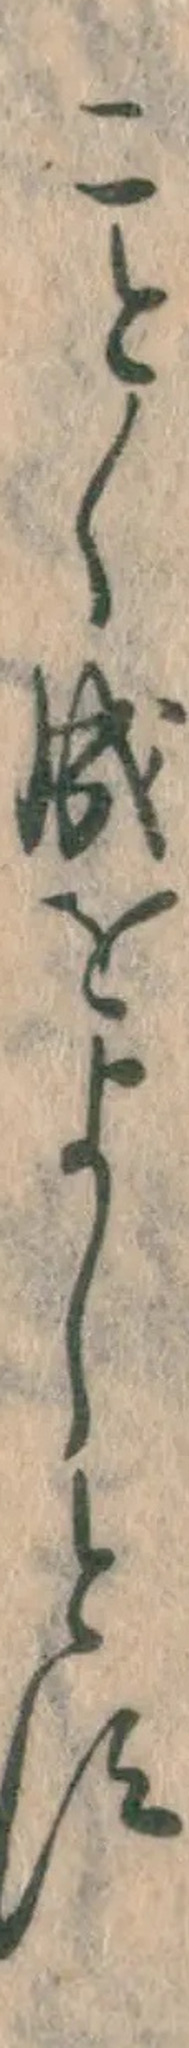ことく成をよしとす
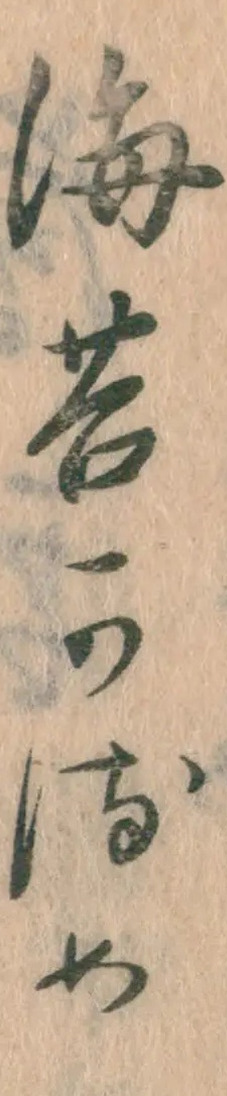海苔かるめ
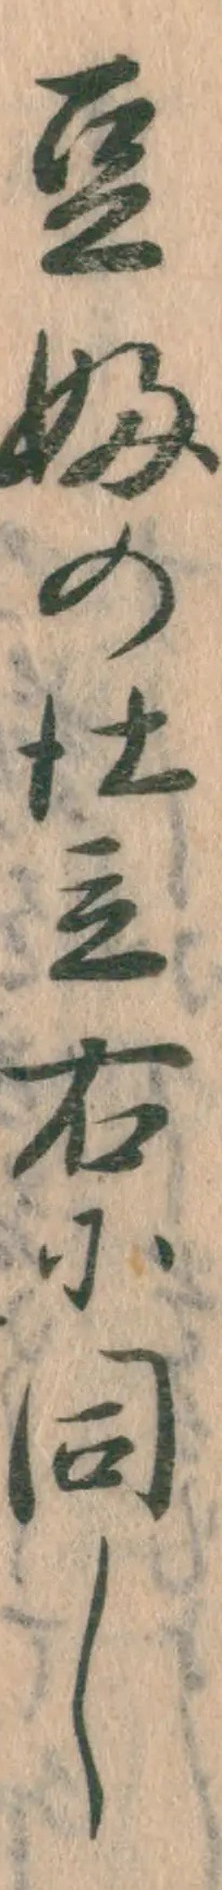豆ふの仕立右に同し
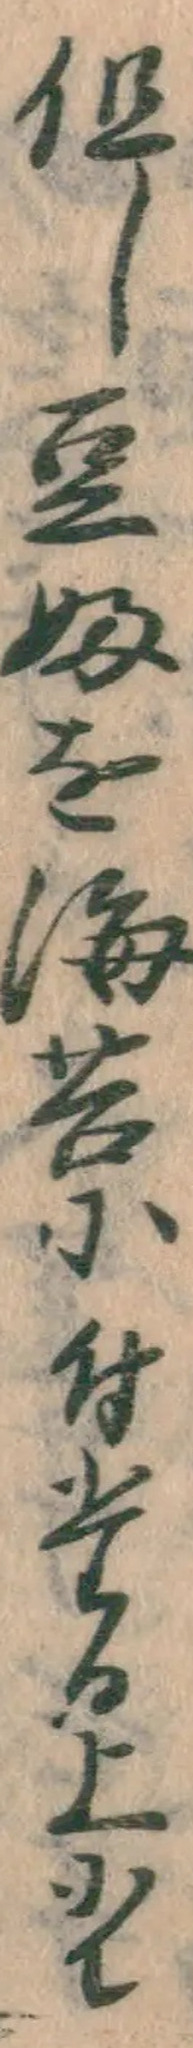但し豆ふを海苔に付たる上にて
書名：豆腐百珍余録
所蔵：国立国会図書館 National Diet Library, JAPAN
